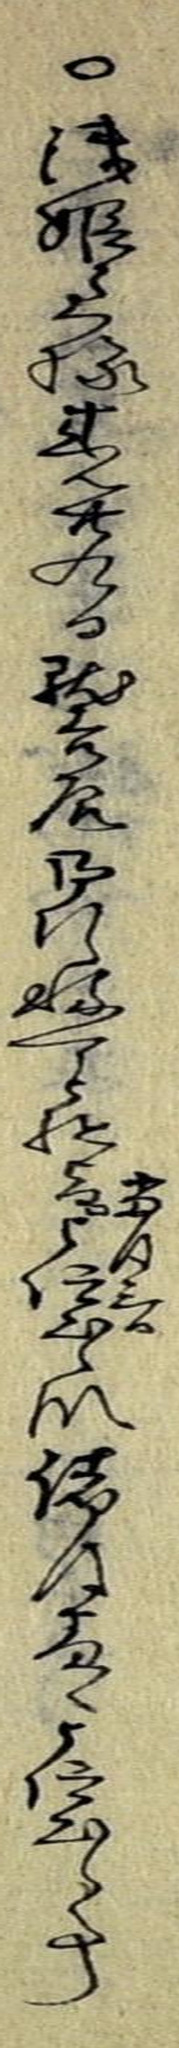○淺姫君様来ル廿九日就吉辰御引移可被遊旨当月三日被仰出候段諸月番へ被仰出候事
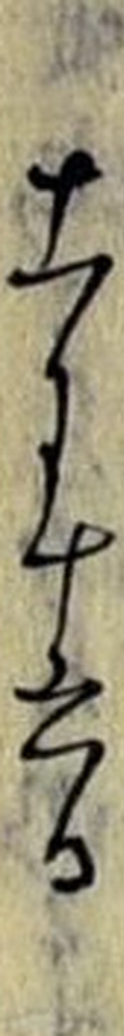十一月十六日
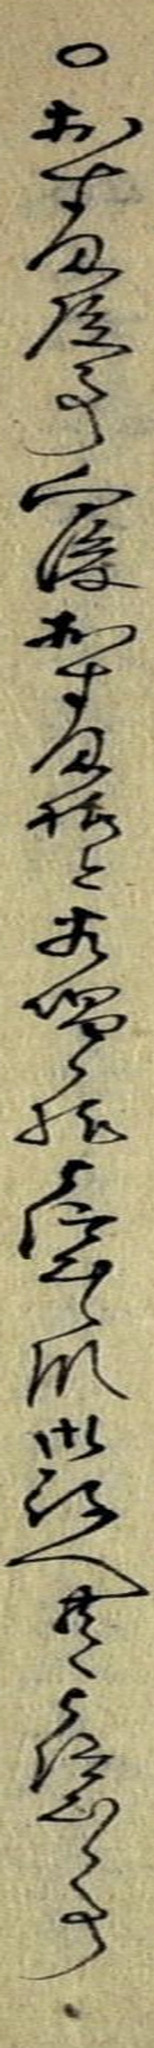○おすま殿事向後おすま様と相唱候様被仰出候段御役人共へ被仰出候事
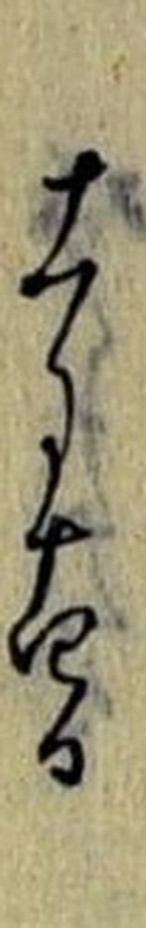十一月十四日
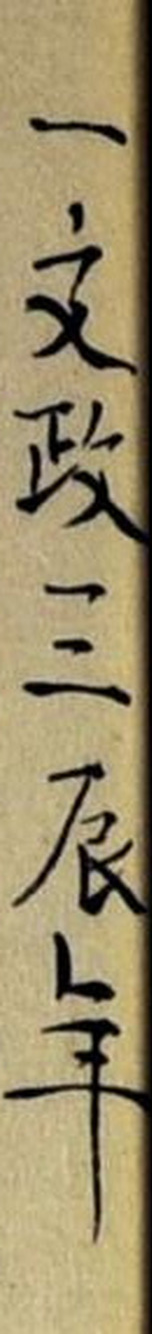一文政三辰年
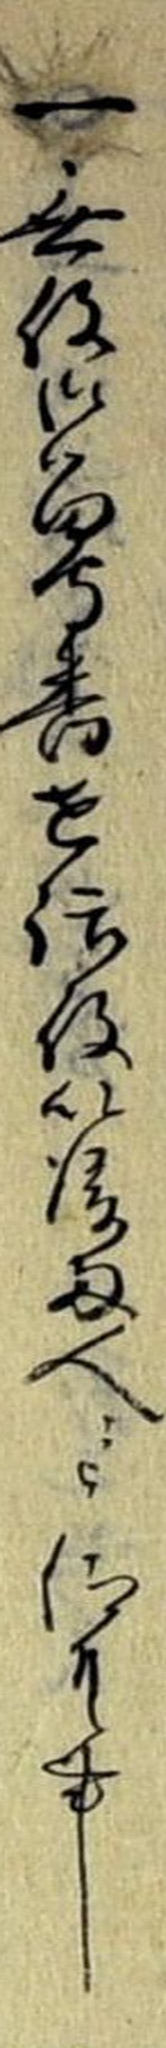一無役御留守番世話役以後両人に被仰付候事
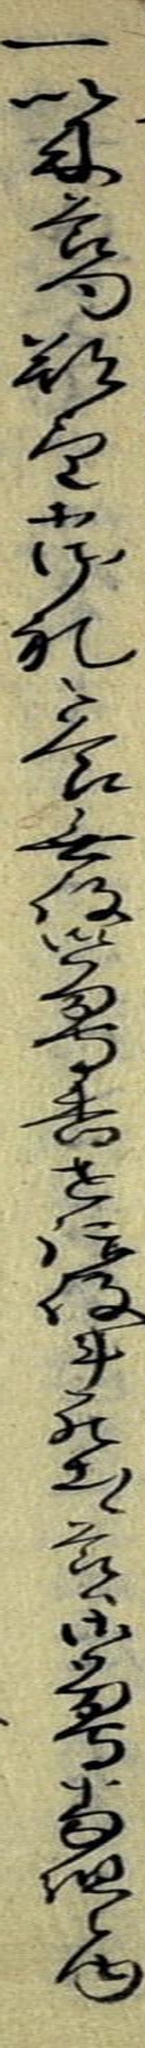一以来節句朔望等御礼之節無役御留守番世話役斗罷出候節は御留守番組之内
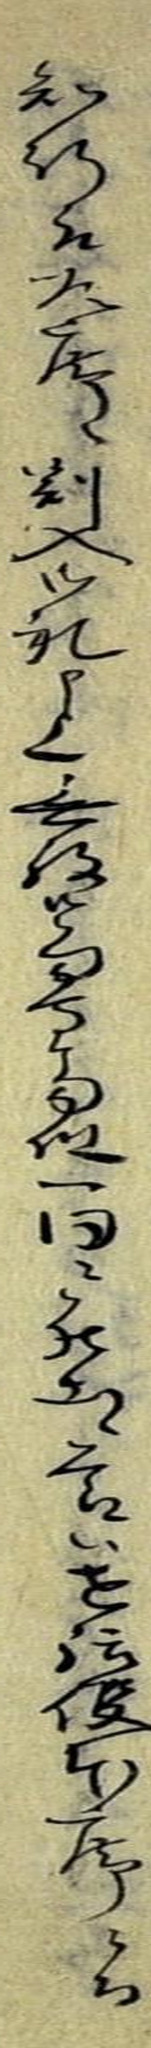知行取順席へ割入御礼申上無役留守番組一同に罷出候節は世話役本席に而
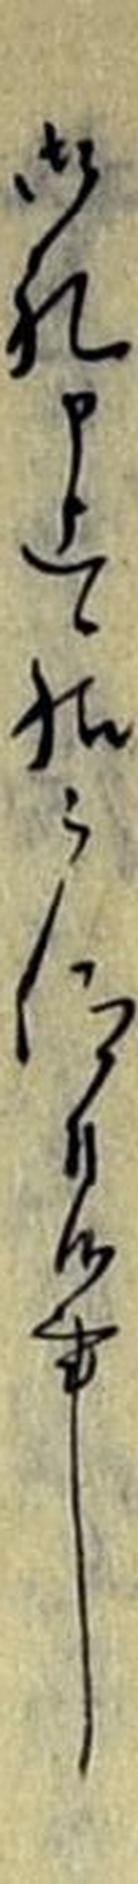御礼申上候様被仰付候事
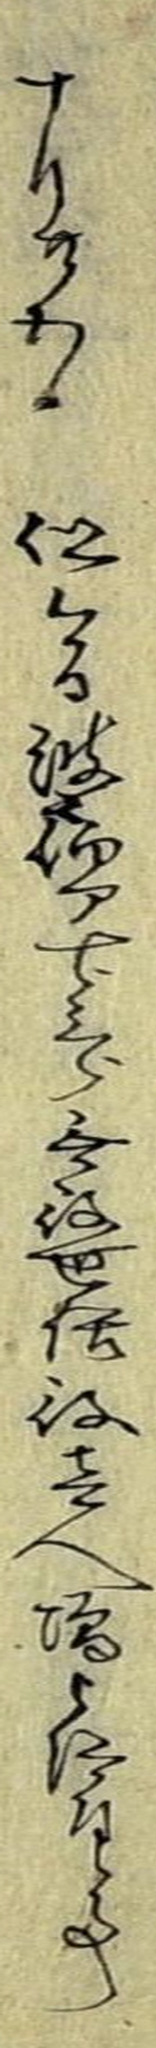十月廿五日但今日波々伯部十郎三郎無役世話役壱人増被仰付候事
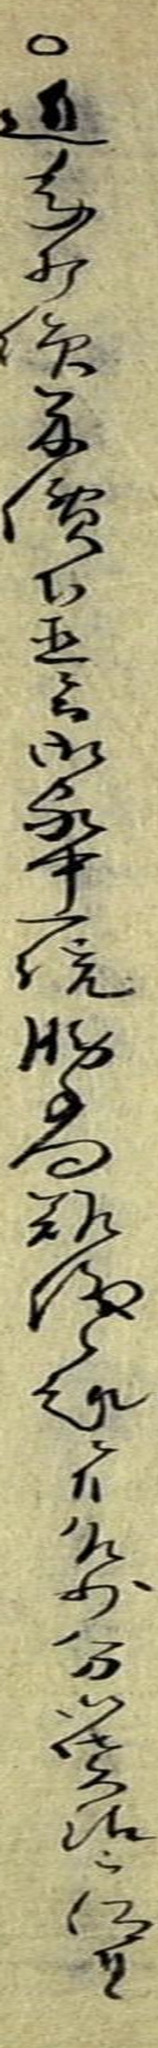○近年打続米価下直に而御家中一統勝手向難儀之趣に付乍少分御貸銀被仰付候
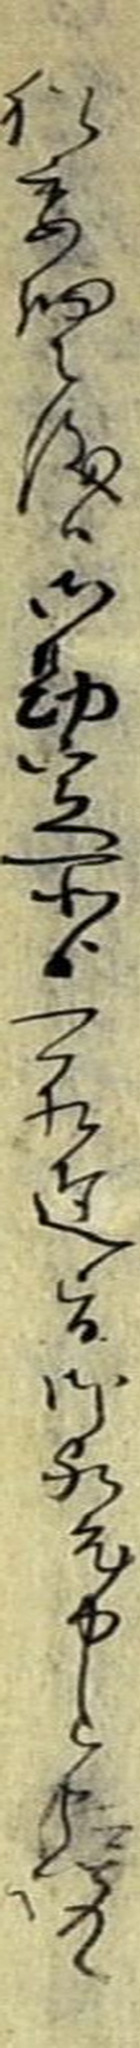猶委細之儀は御勘定所ゟ可相達旨御家老中被申聞候
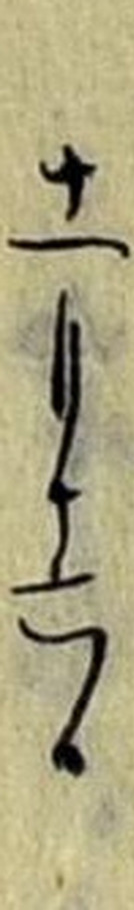十一月十六日
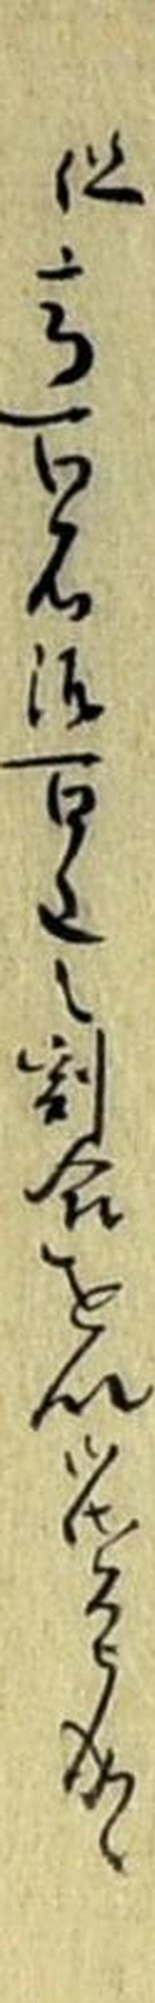但高百石銀百匁之割合を以御貸被成候

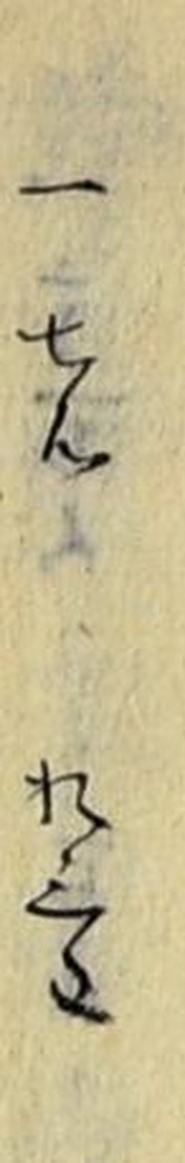一七石拾三匁
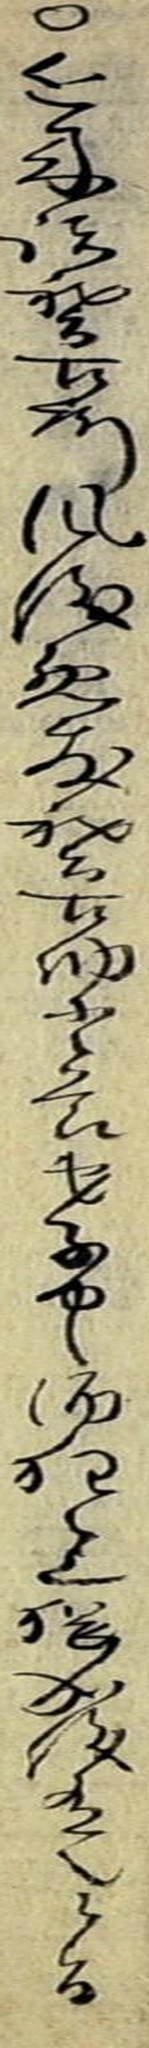○近来御稽古所風儀悪敷稽古納等之節弟子中酒狂之上猥成義有之候旨
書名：命令之部 四
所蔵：福井県文書館 Fukui Prefectural Archives
